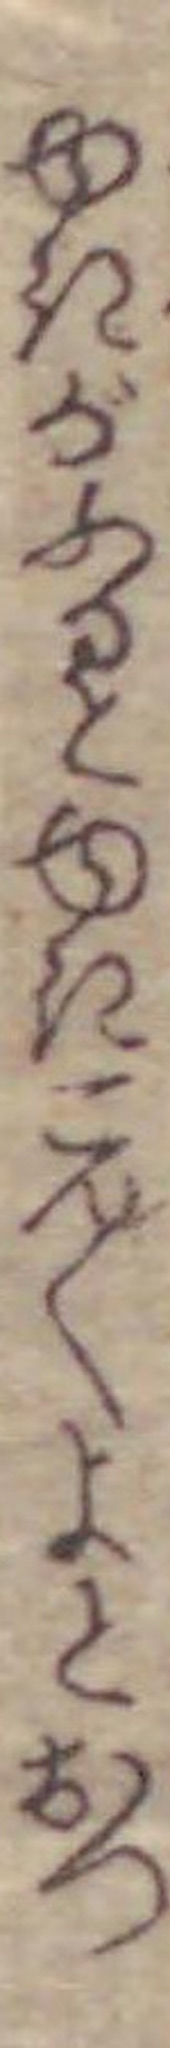ゆきがふるとゆきこん〳〵よとおつ
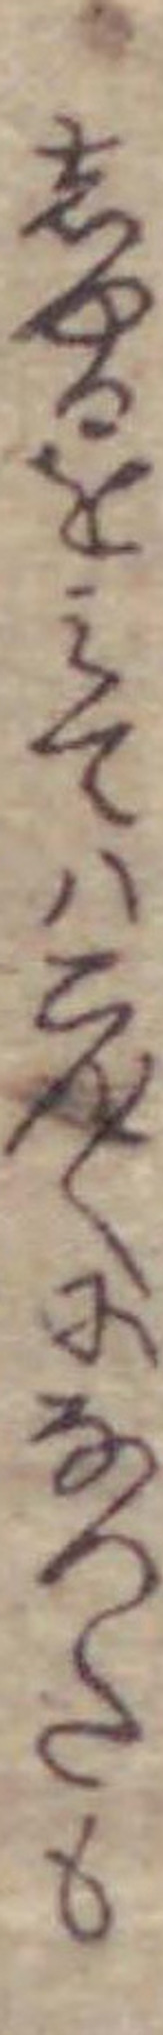しやるをみてはこん〳〵になつたも
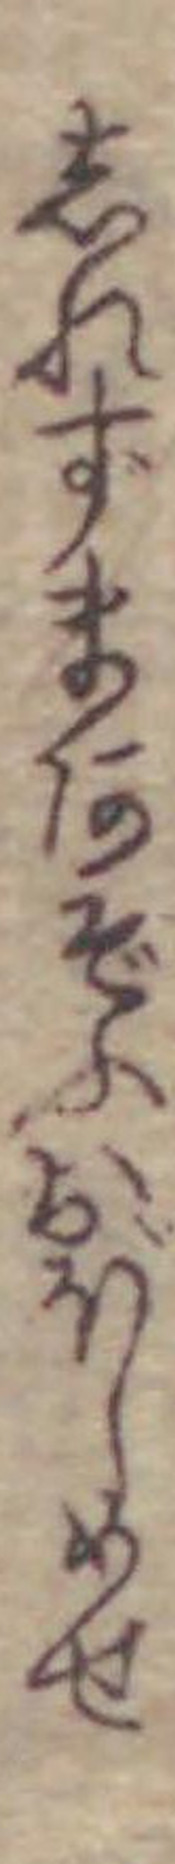しれずま何ぞふおぼしめせ
